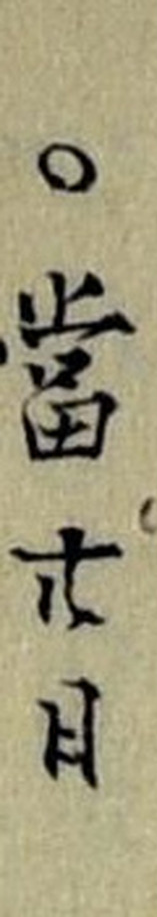〇当廿日
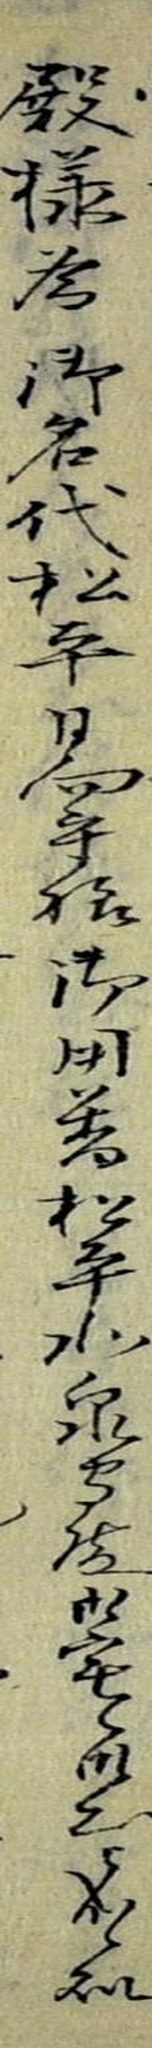殿様為御名代松平日向守様御用番松平和泉守殿御宅へ御出被成候処
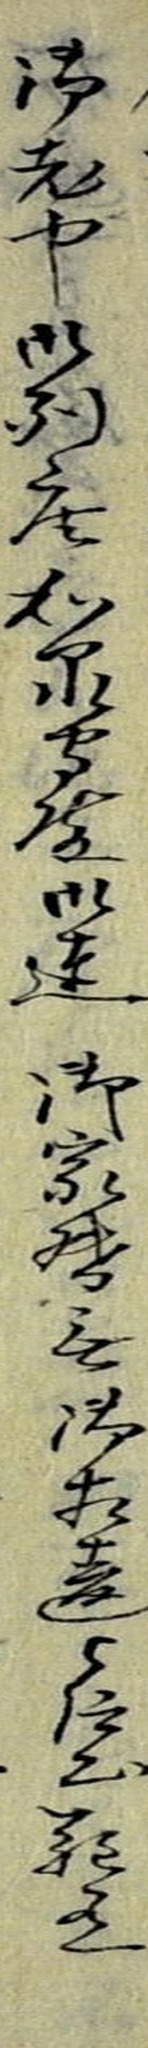御老中御列座和泉守殿御達御家督無御相違被仰出難有
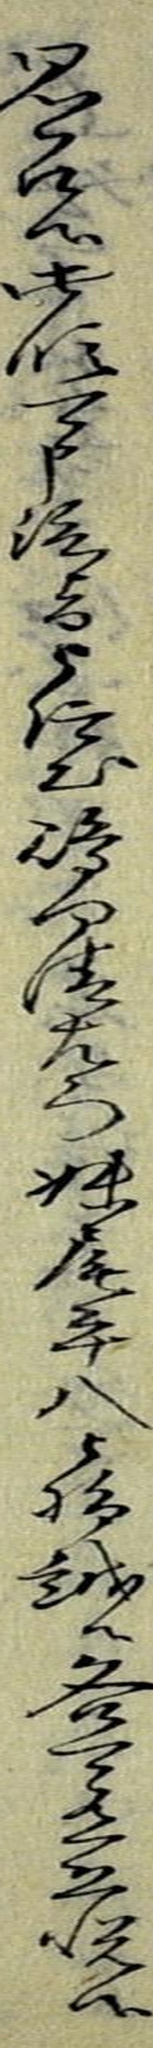思召候此段可申渡旨被仰出嶋田清左衛門妹尾平八被指越候各可有恐悦候
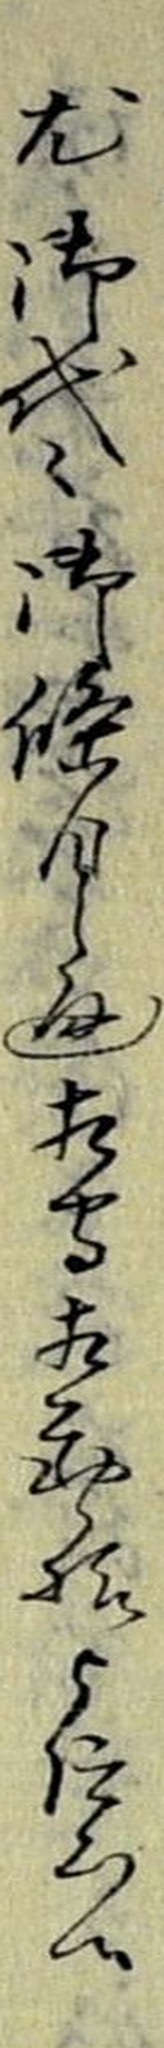尤御代々御条目之通相守相勤候様被仰出候
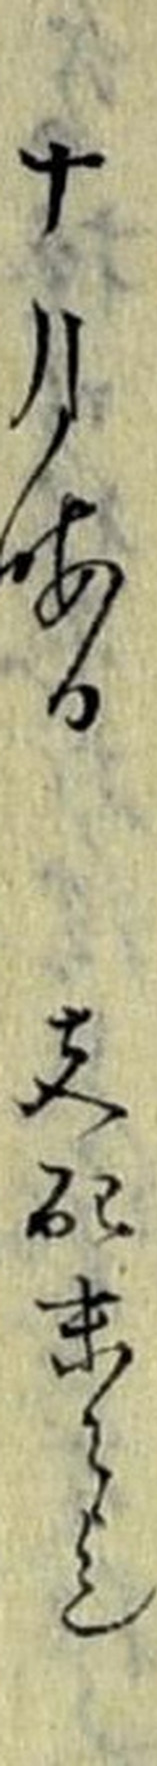十月晦日支配末々迄
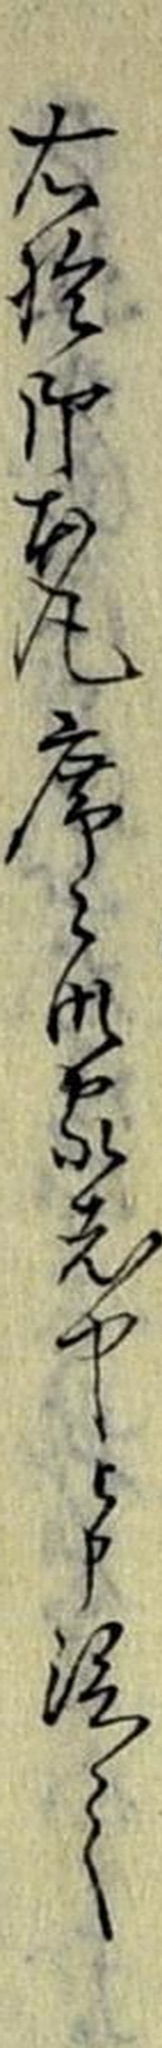右於御本丸席々御家老中被申渡之
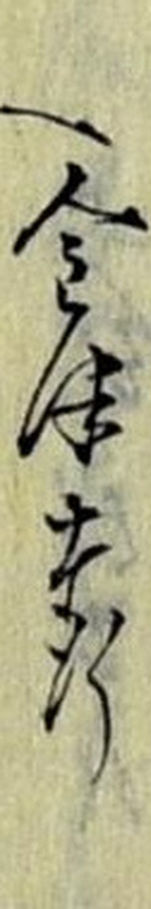金津奉行
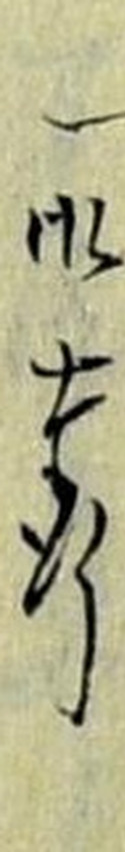御奉行
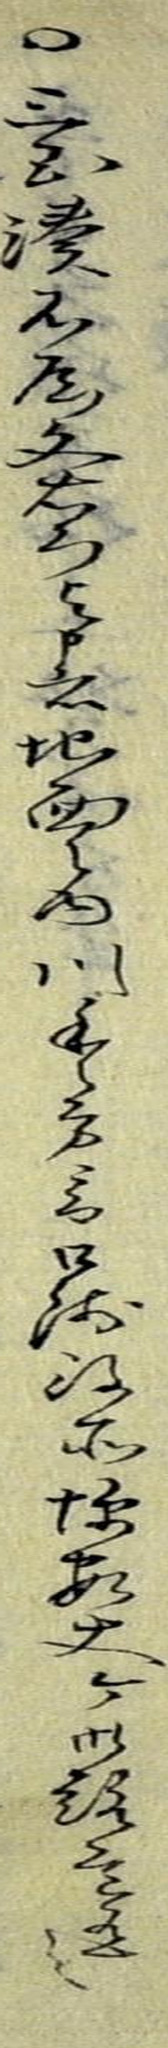〇三国湊石屋文右衛門と申者地面之内川水之方に而口銭役所坪数丈ヶ御趣意有之
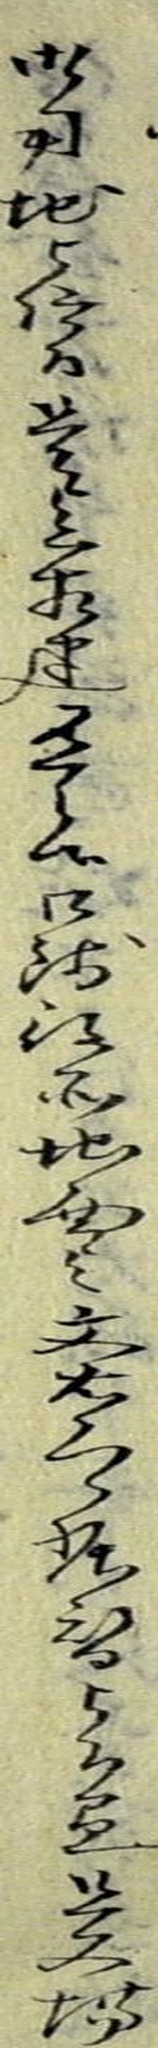御用地被仰付是之上相建有之候口銭役所地面と文右衛門へ掘替被下置且又場
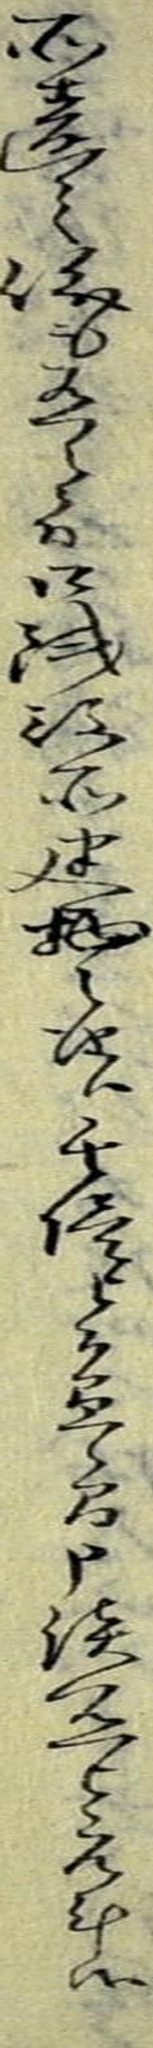所違之儀も有之に付口銭役所建物之儀は其侭被下置候間申談宜被取計候
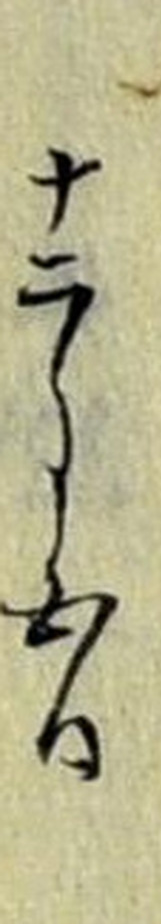十二月五日

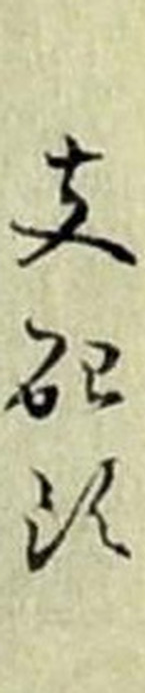支配頭
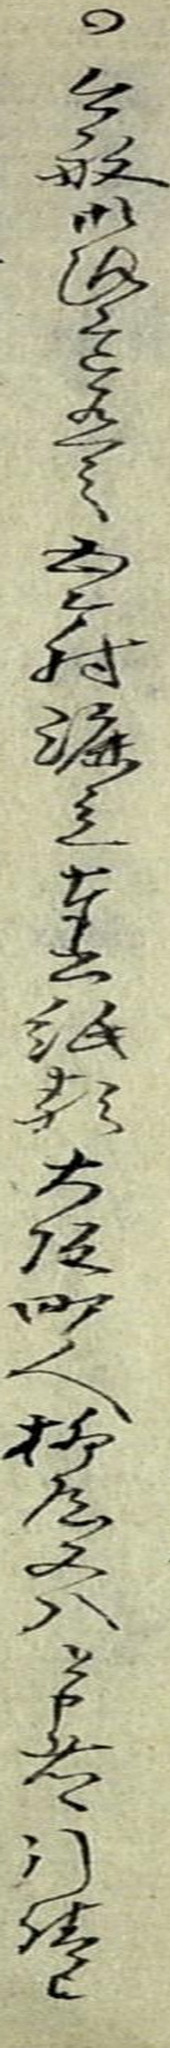〇今般御趣意有之五ケ村漉上奉書紙類大坂町人柳屋又八と申者へ引請被
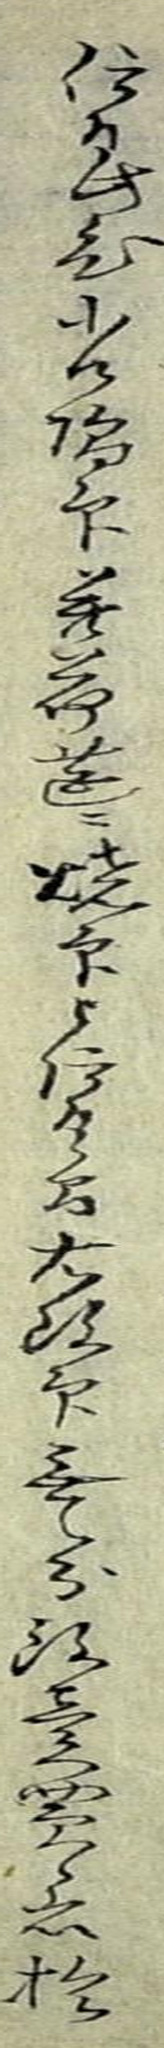仰付此度小口増印并荷莚に焼印被仰付候間右改印無之分致売買候者於
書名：命令之部 六
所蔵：福井県文書館 Fukui Prefectural Archives
